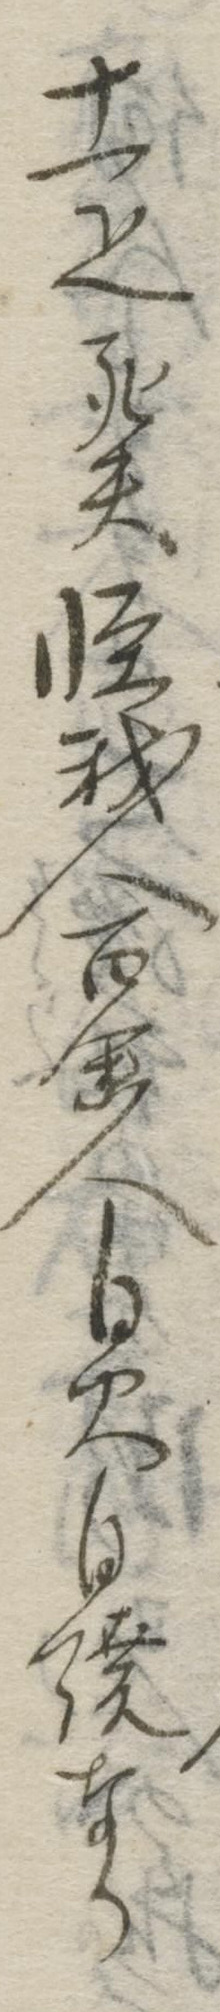十一疋死失怪我人百余人自火自焼なり
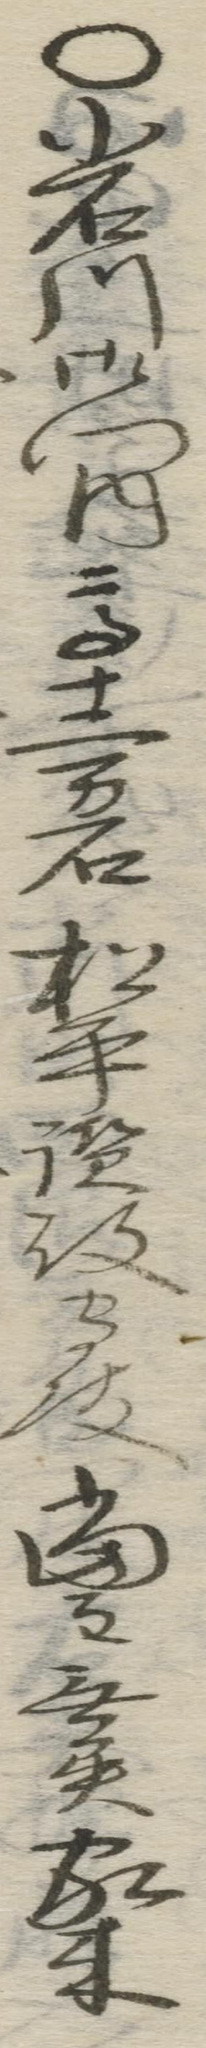○小石川御門内高十二万石松平讃岐守殿当主無災家来
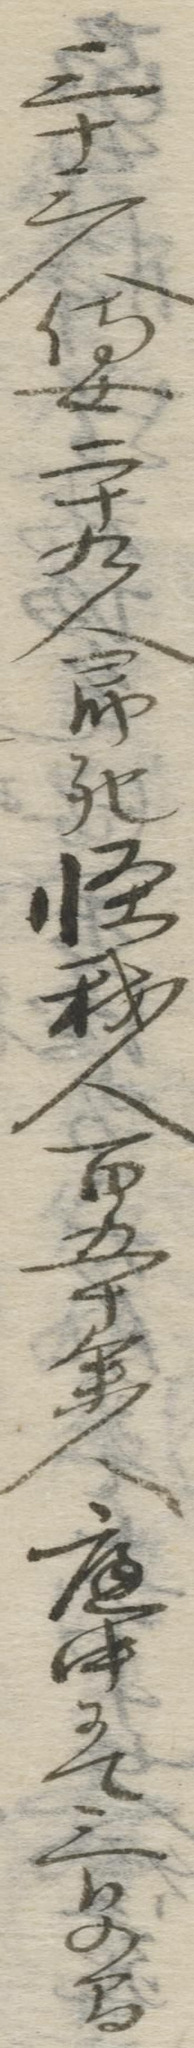三十三人侍女二十九人即死怪我人百五十余人庭中にて三日の間
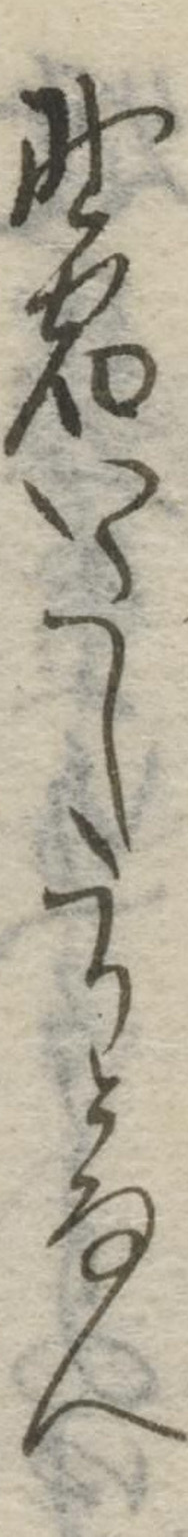野宿いたしたりとなん
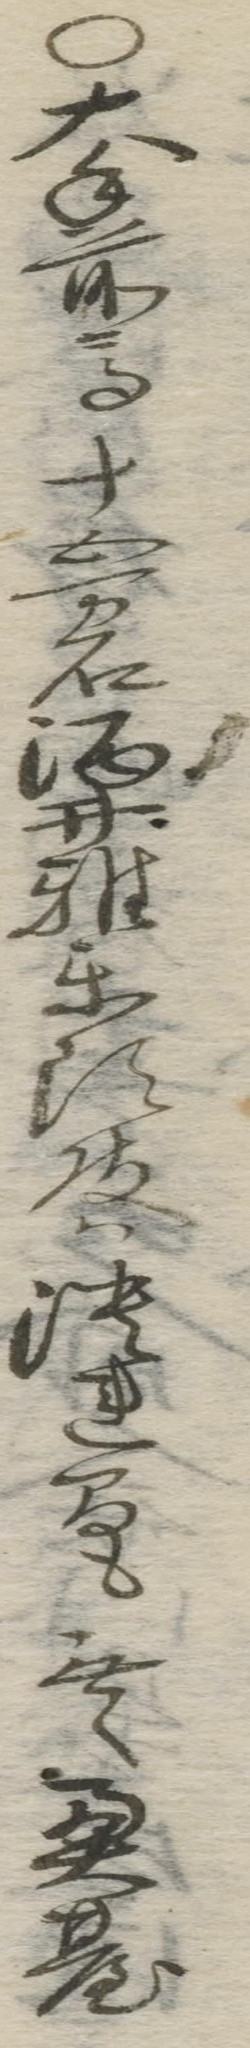○大手前高十五万石酒井雅楽頭殿ハ潰れ間も無之奥臺
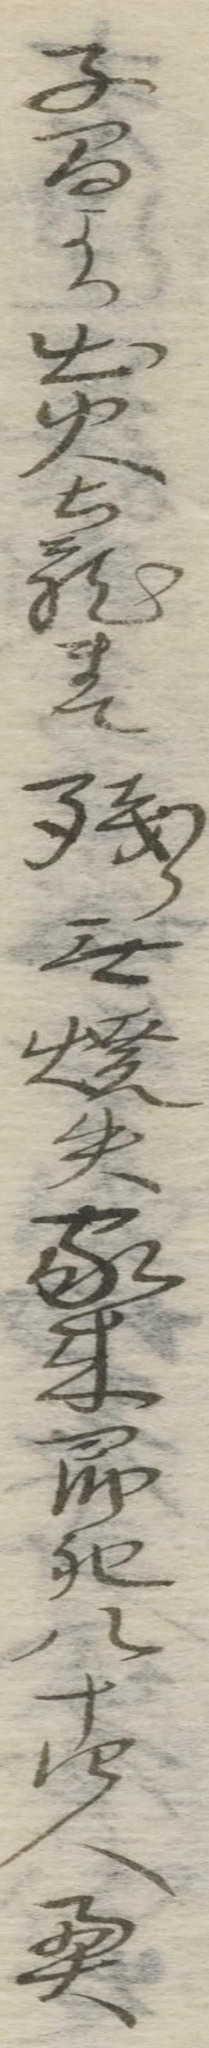子間より出火土蔵まて残り無焼失家来即死八十四人奥
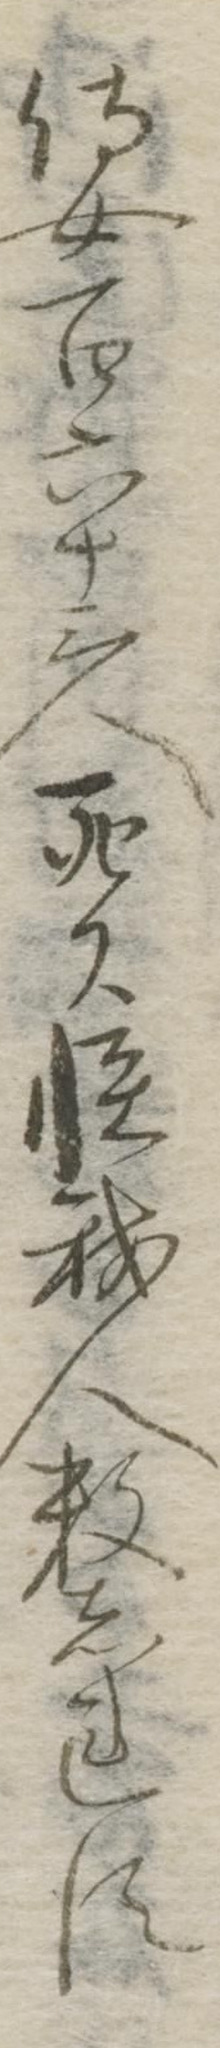侍女百六十三人死ス怪我人数しれす
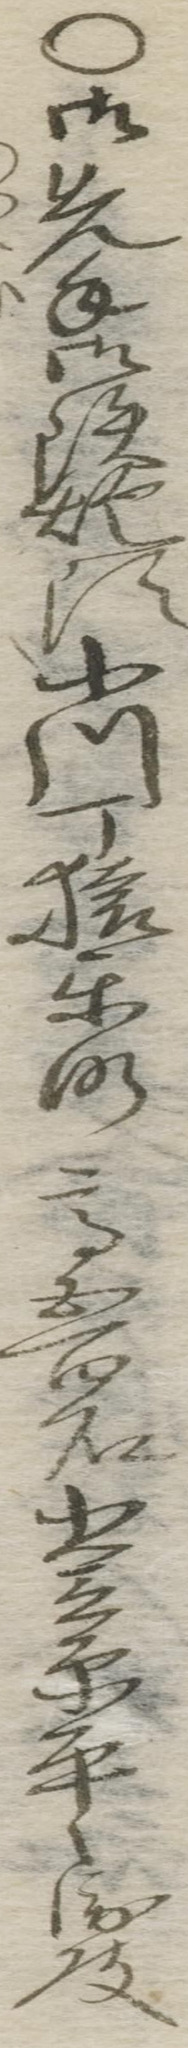○御先手御鉄炮頭小川丁猿楽町高五百石小笠原平兵衛殿
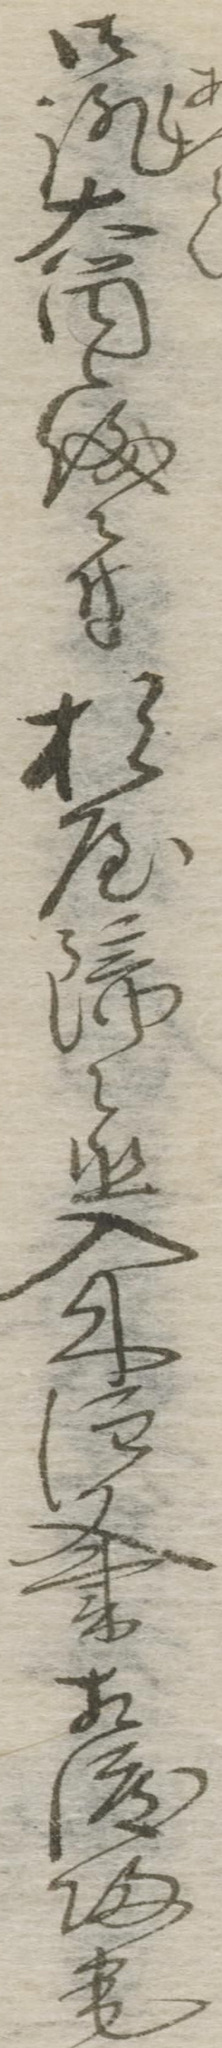御誂大筒之儀ニ付杉屋録之丞入来注文書相渡帰宅
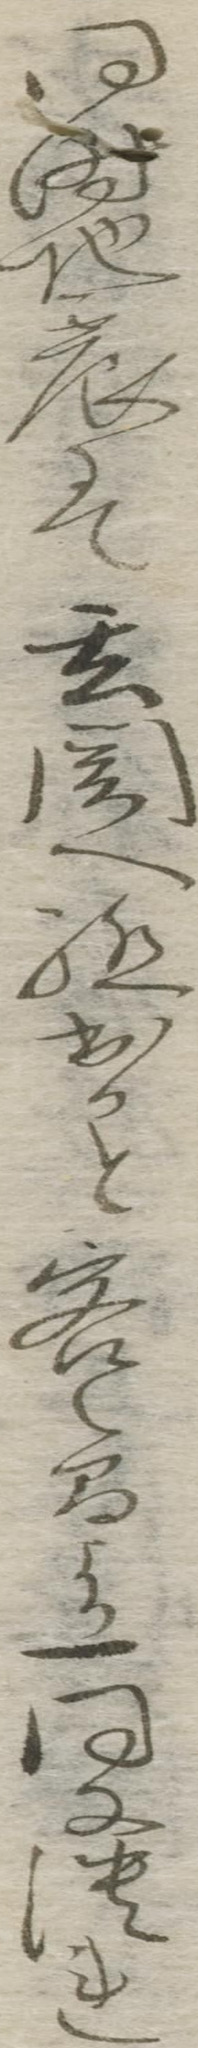同時地震にて玄関へ馳出ると客之間より一同に潰れ
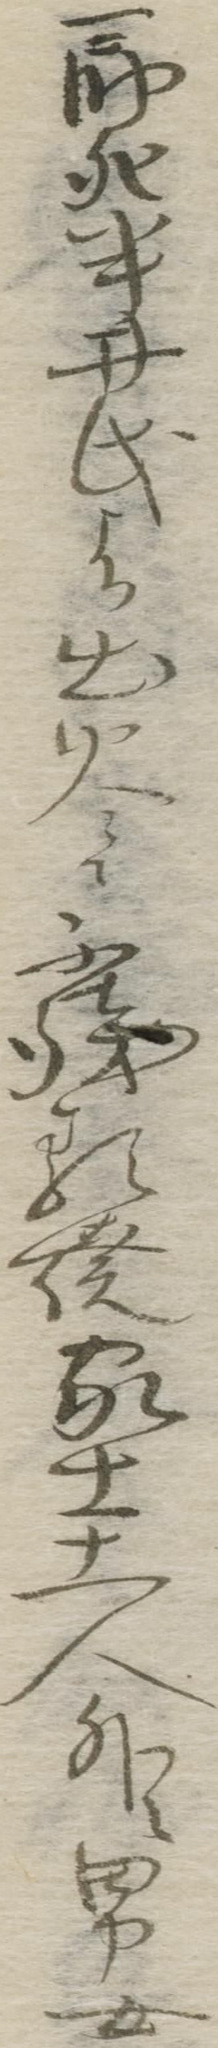即死半井氏より出火ニて不残類焼家士十一人外ニ男女

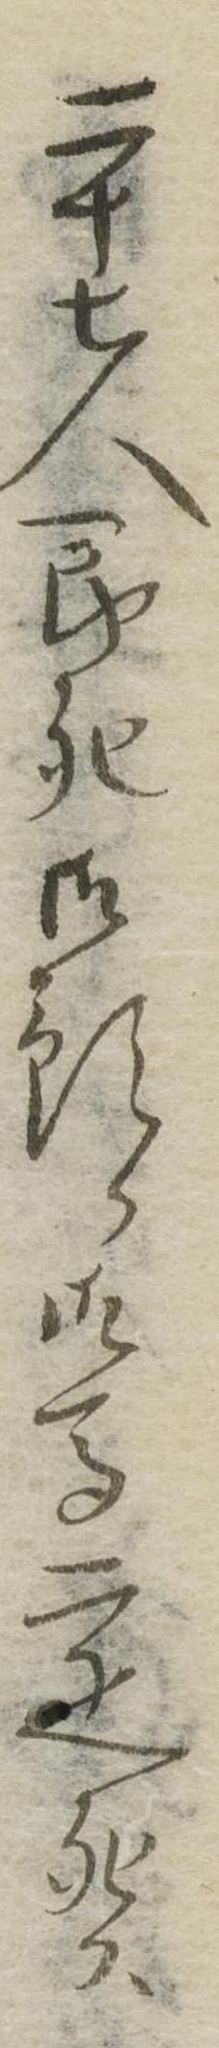二十七人即死御預り御馬二疋死ス
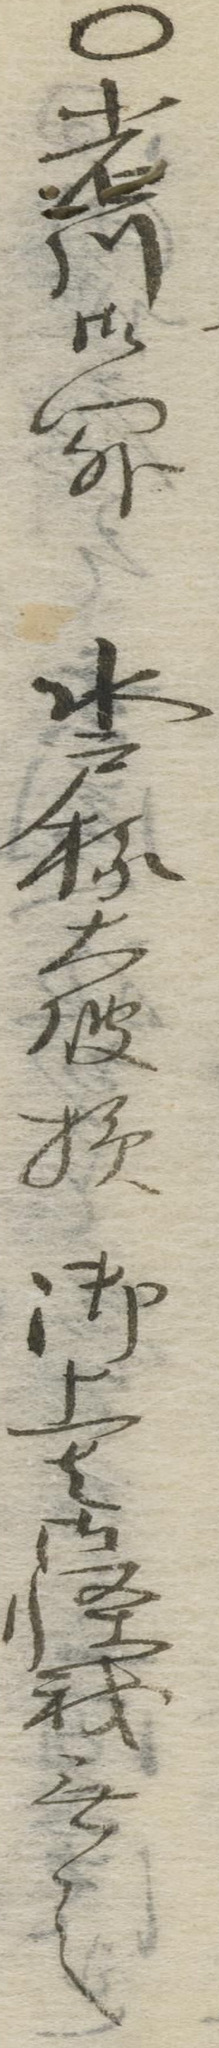○小石川御門外水戸様大殿様御上は御怪我無之
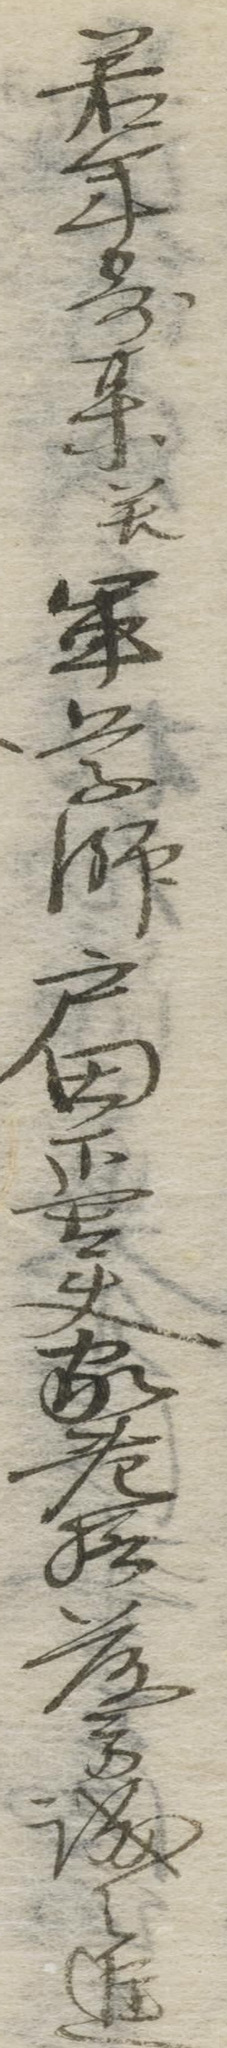若年寄某并軍学師戸田正太夫家老格藤方誠之進
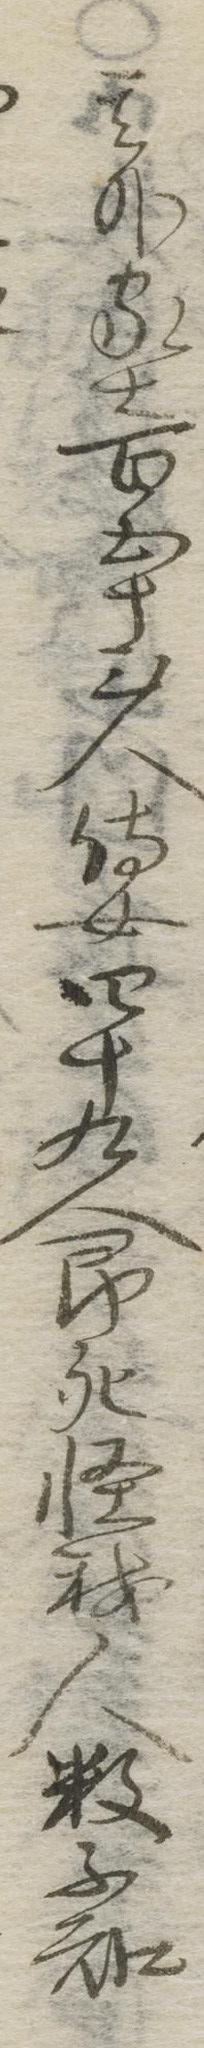其外家士百五十三人侍女四十九人怪我人数不知
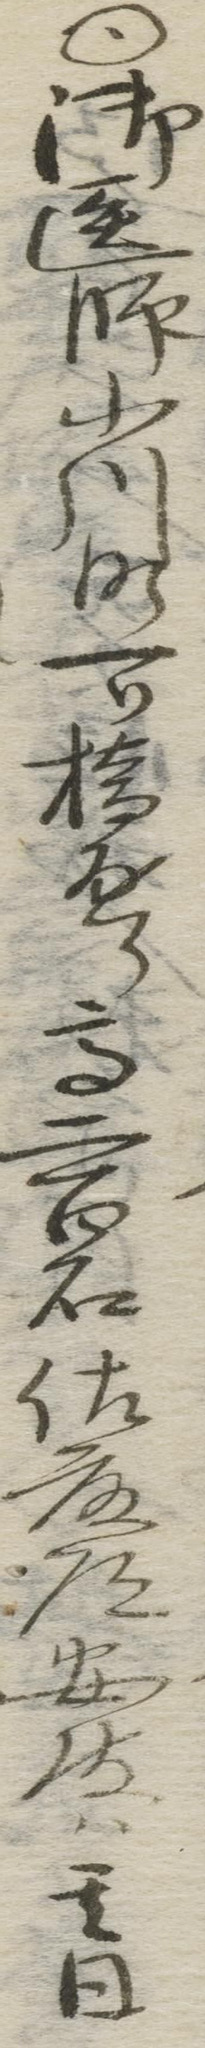○御医師小川町一ツ橋通り高二百石佐藤道安殿ハ其日
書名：江戸中諸屋敷　地震竒談録
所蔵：東京大学地震研究所図書室 Earthquake Research Institute Library, The University of Tokyo, JAPAN
